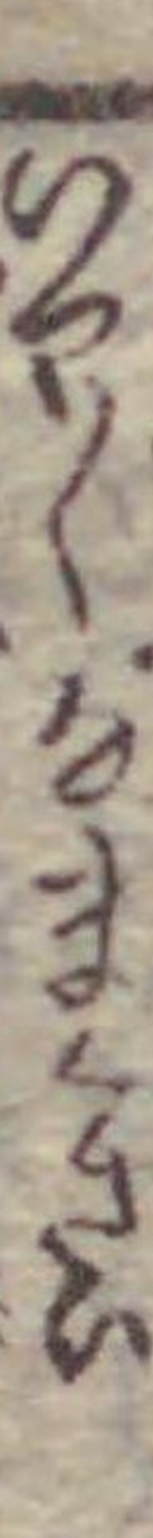いや〳〵なまくさい
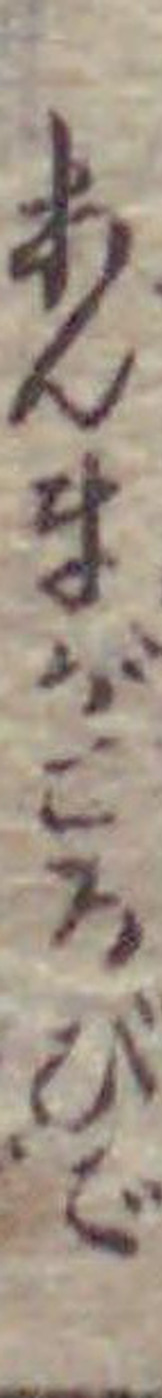あんまがころびで
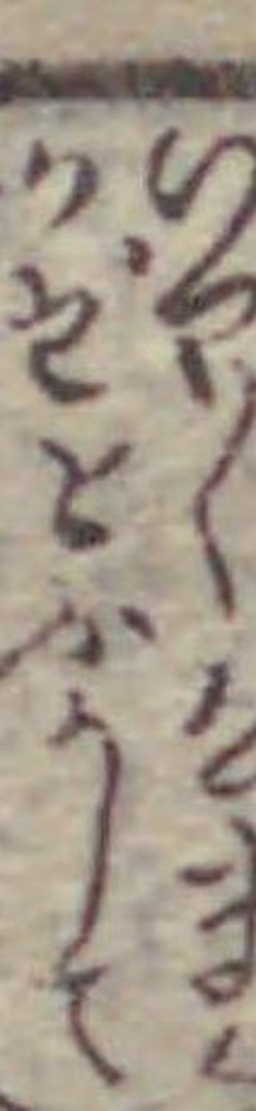かぜをふかして
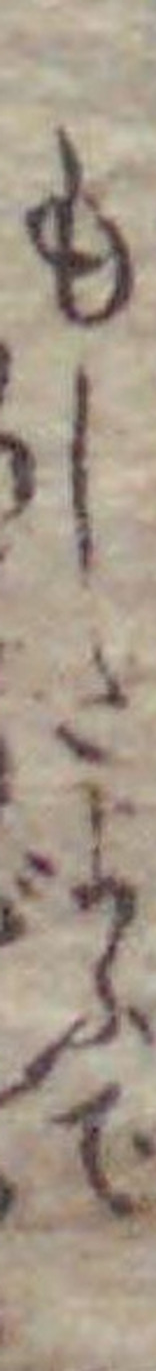もしたよふで
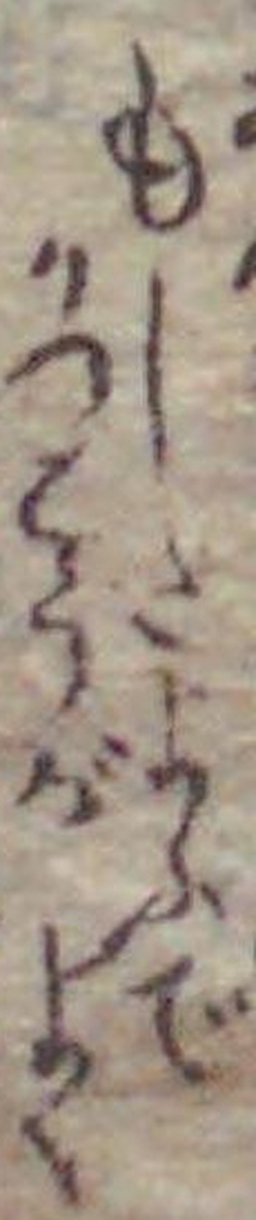かつこうがよく
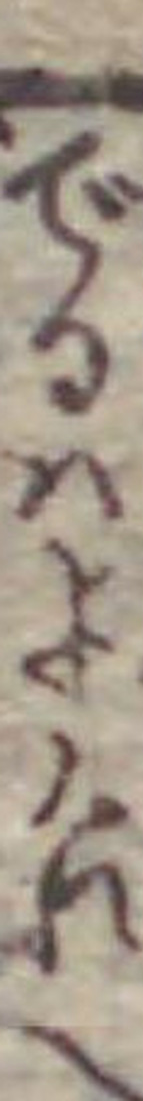でるはよかれ
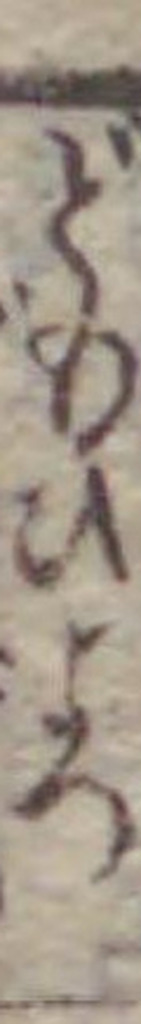どもひよつ
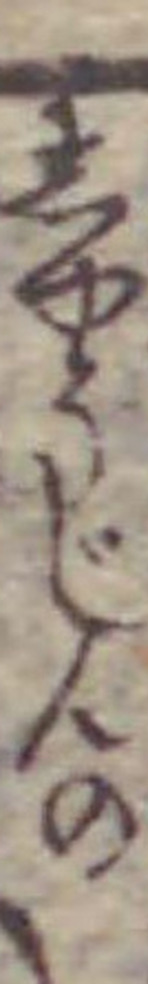しやうじんの
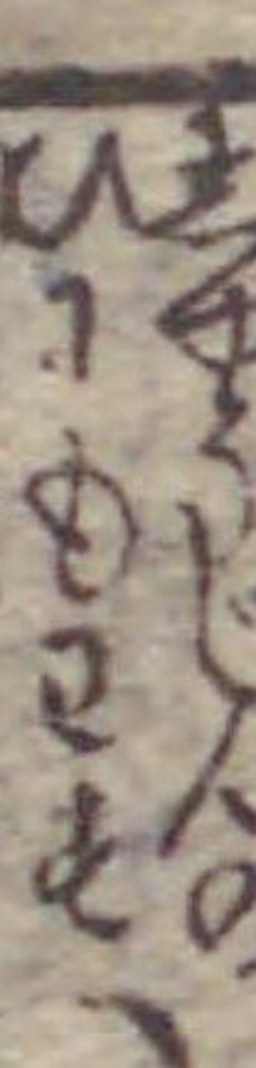ひにもわす
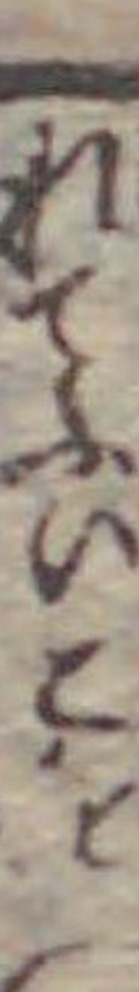れてふいこを
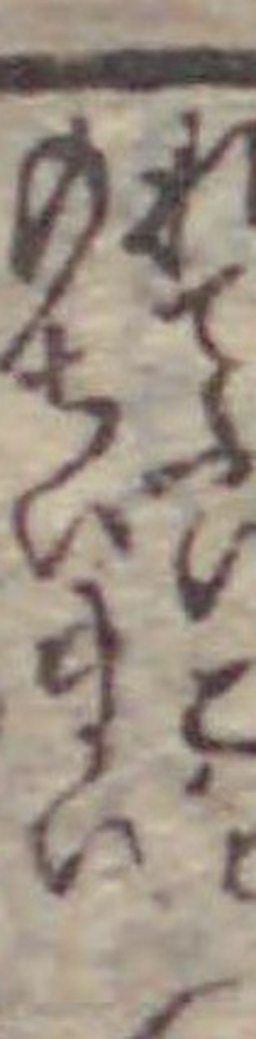もちいまい
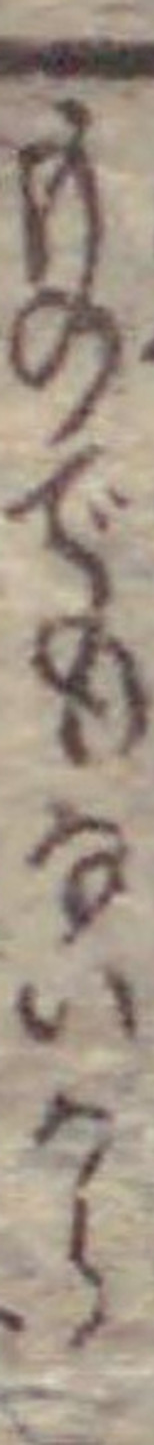ものでもないから
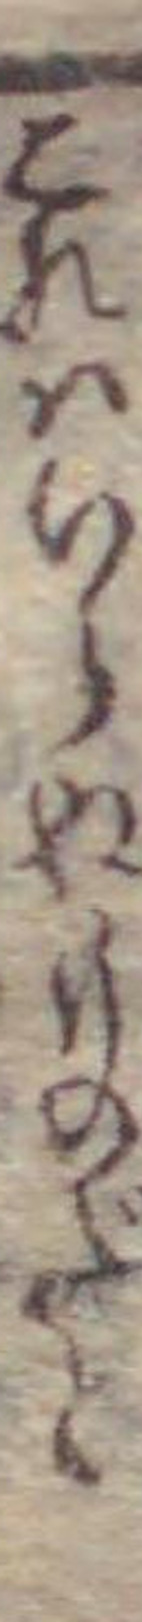これはいらぬものだと
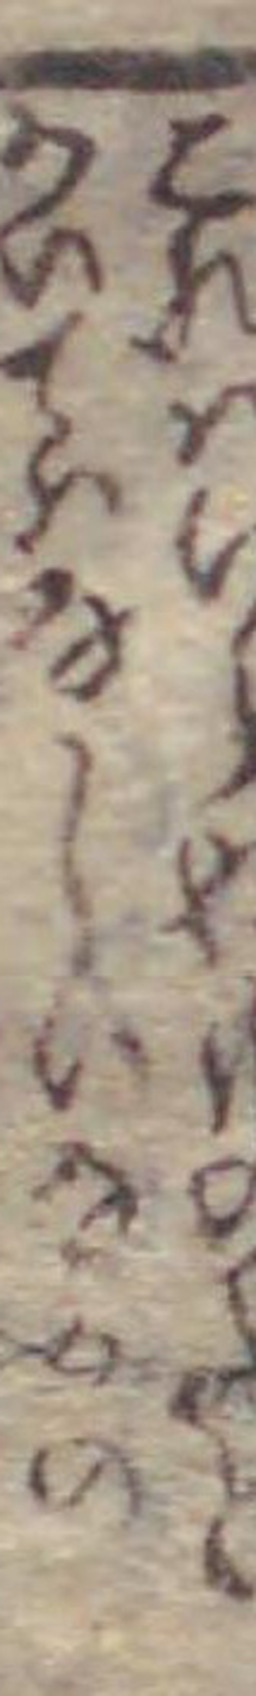かいてはなしいなかの
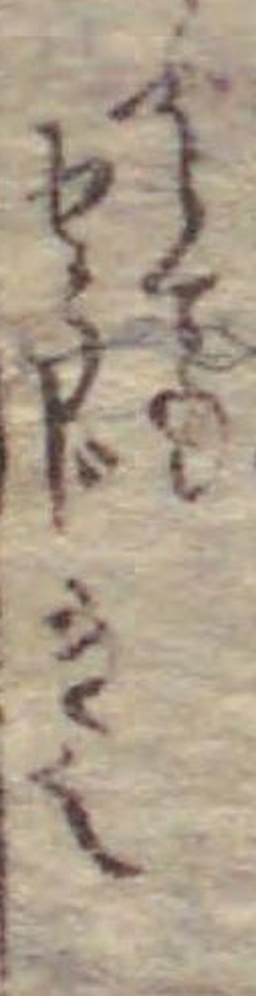せうじき也

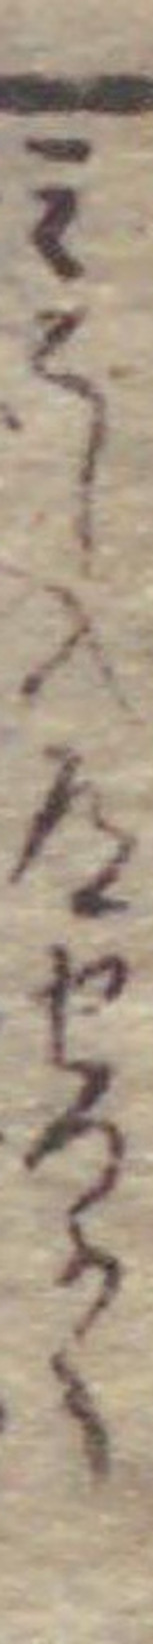みこし入道せつかく
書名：化物見世開 : 2巻
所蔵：国立国会図書館 National Diet Library, JAPAN
